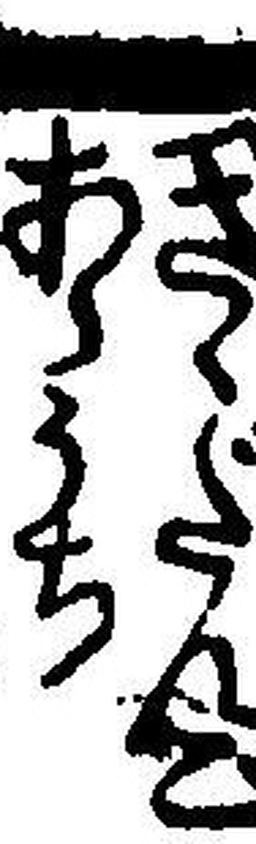あらうち
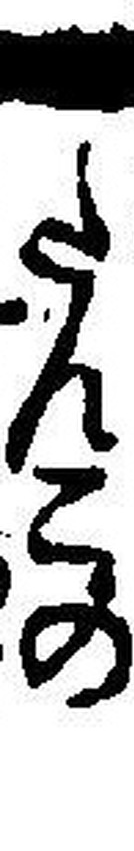たんこの
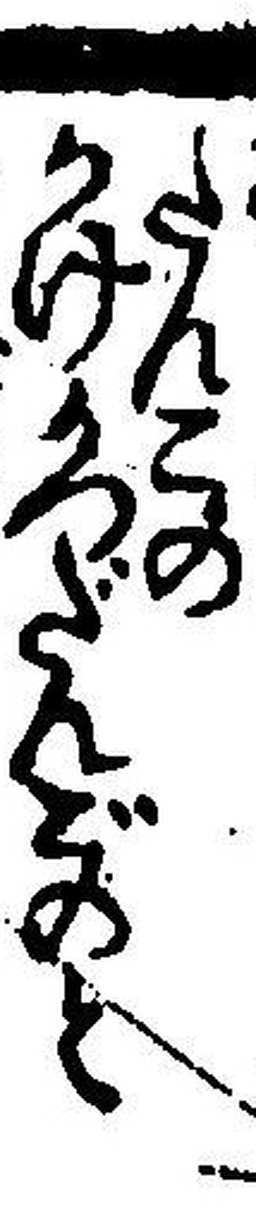かけかつだんごのと
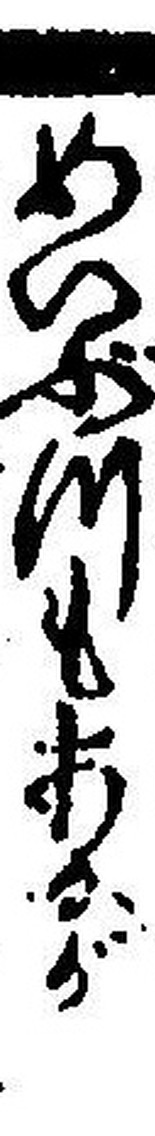めいぶつもあるが
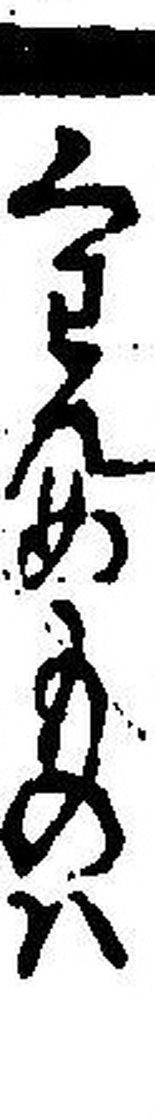くわんめものは
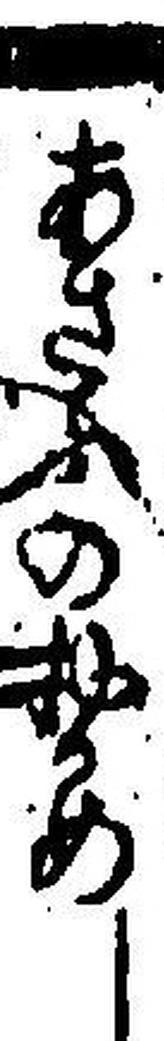あさふのおかめ
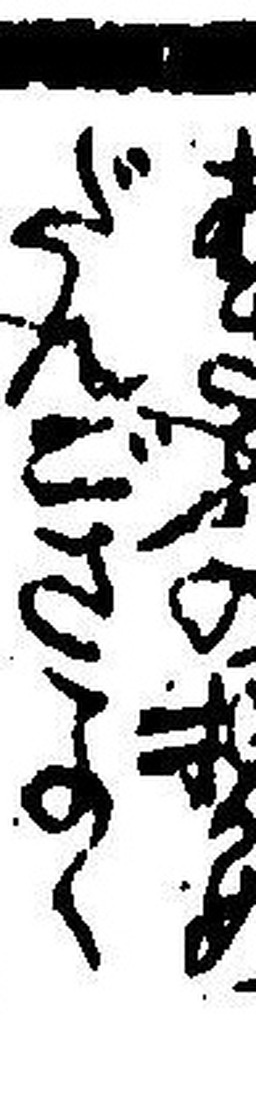だんごさよく
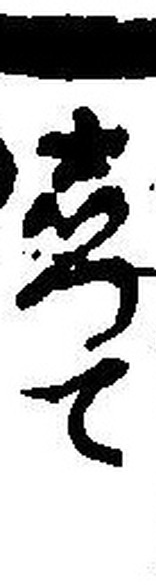しつて
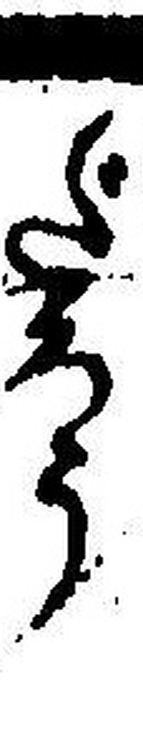だろう
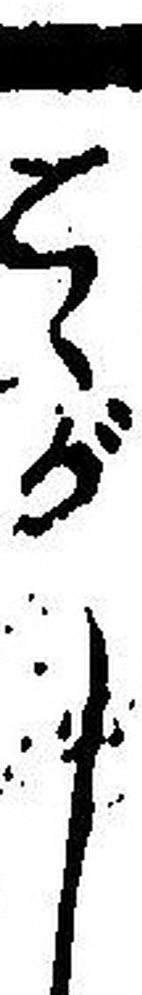こゝが
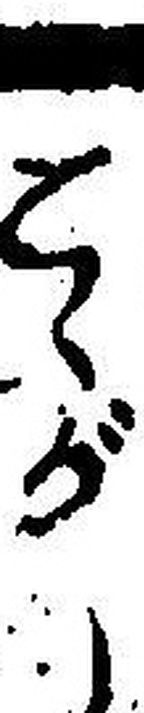こゝが
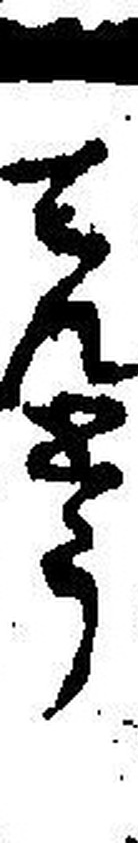てんとう
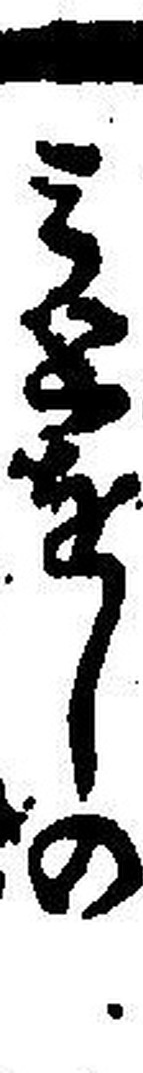みとをしの
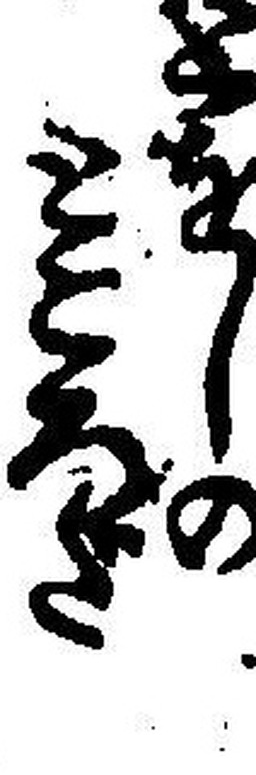ところだ

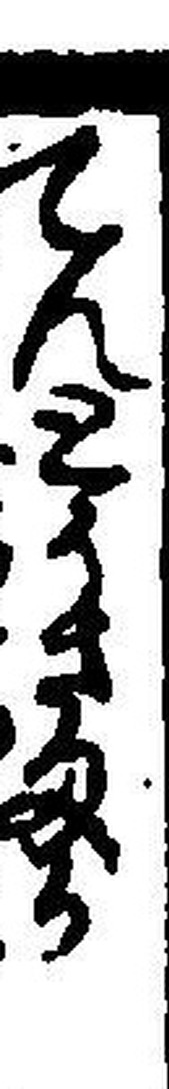てんとうさまか
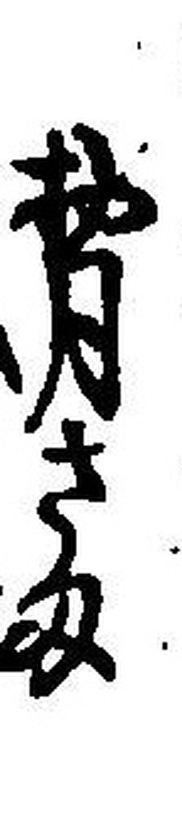お月さま
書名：徳若水縁起金性 / 樹下石上作
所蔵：東京大学総合図書館 General Library in the University of Tokyo, JAPAN
